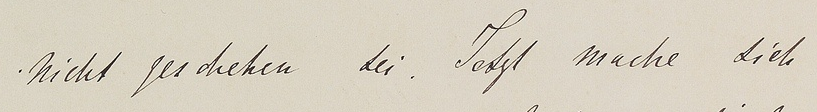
nicht geschehen sei. Jetzt mache sich
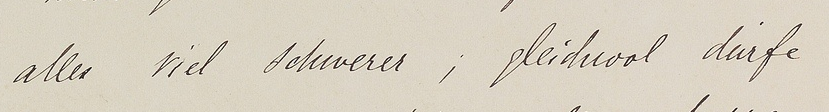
alles viel schwerer; gleichwol dürfe
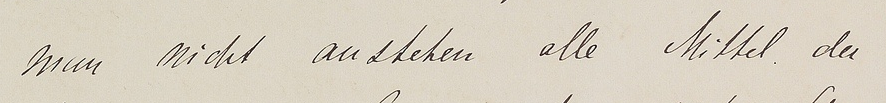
man nicht anstehen alle Mittel der
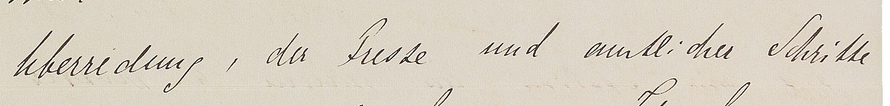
Überredung, der Presse und amtlicher Schritte
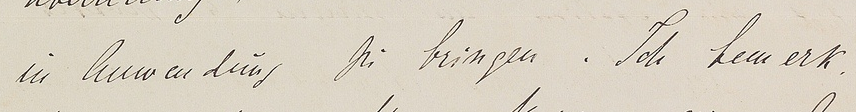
in Anwendung zu bringen. Ich bemerk-
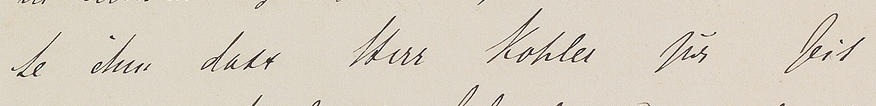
te ihm dass Herr Kohler zur Zeit
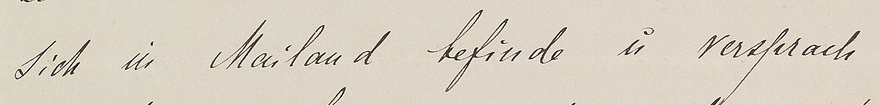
sich in Mailand befinde u versprach
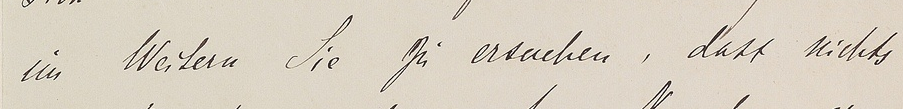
im Weitern Sie zu ersuchen, dass nichts
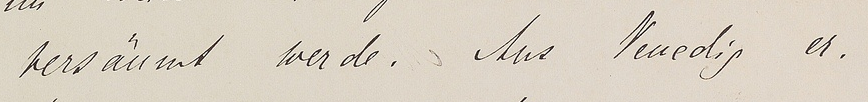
versäumt werde. Aus Venedig er-
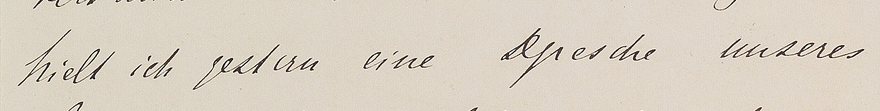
hielt ich gestern eine Depesche unseres
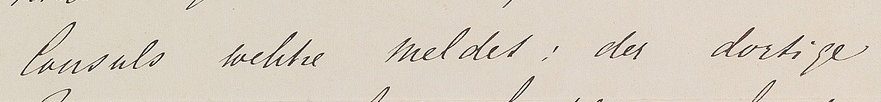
Consuls welche meldet: der dortige
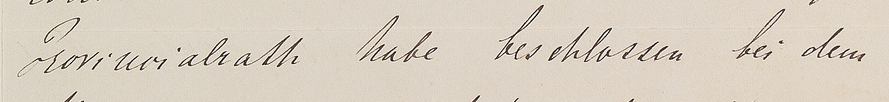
Provincialrath habe beschlossen bei dem
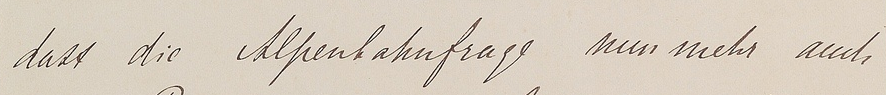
dass die Alpenbahnfrage nunmehr auch
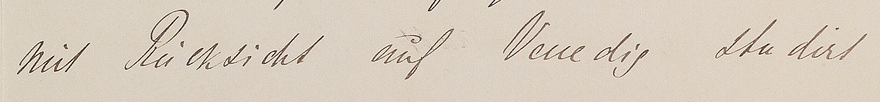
mit Rücksicht auf Venedig studirt
